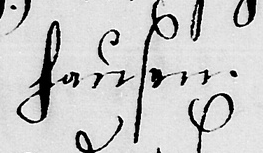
fhausen.
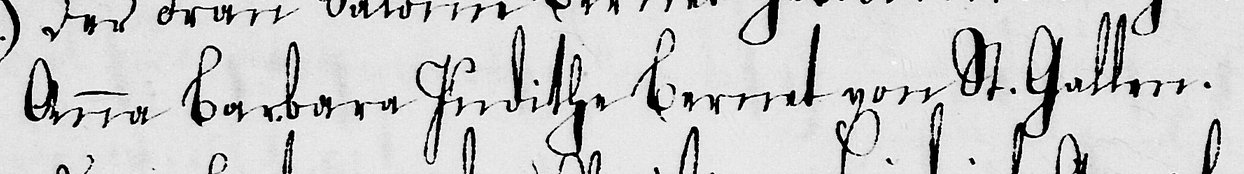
Anna Barbara Juditha Bernet von St. Gallen.
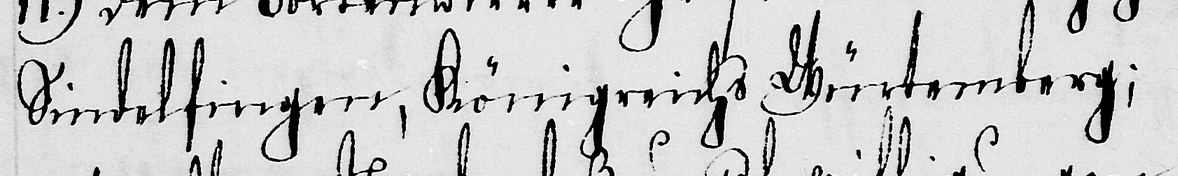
Sindelfingen, Königreich Würtemberg;
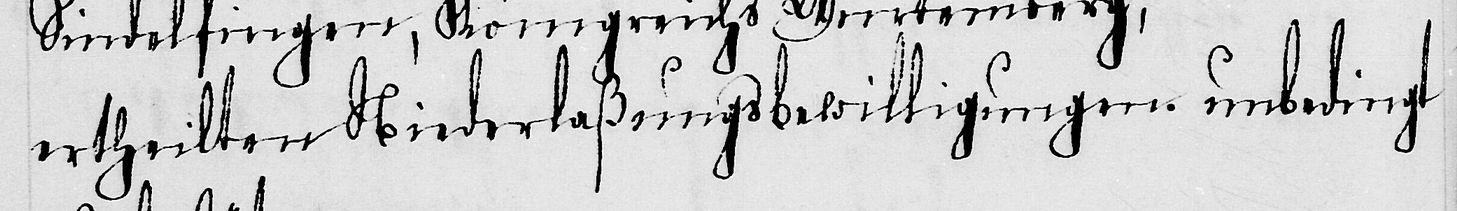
ertheilten Niederlaßungsbewilligungen unbedingt
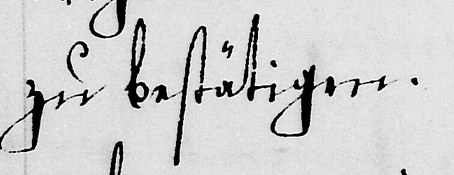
zu bestätigen.
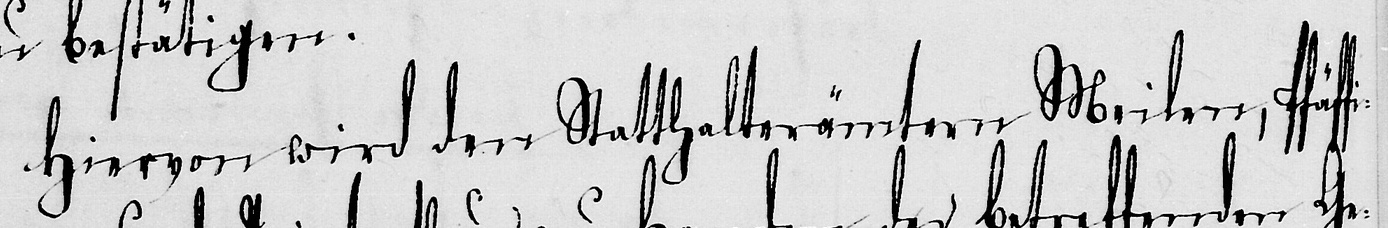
Hiervon wird den Statthalterämtern Meilen, Pfäf¬
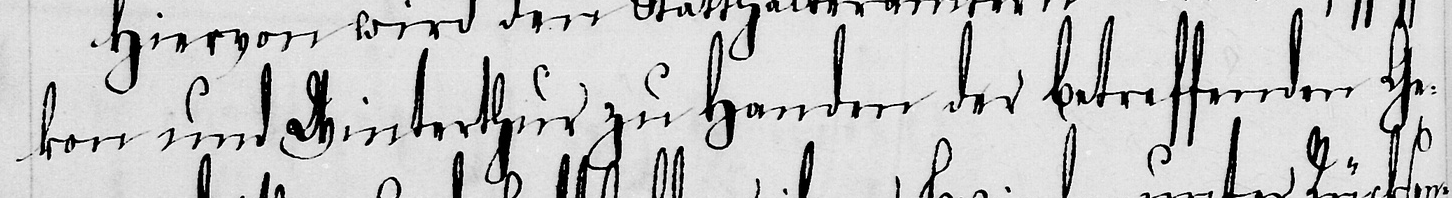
ikon und Winterhtur zu Handen der betreffenden Ge¬
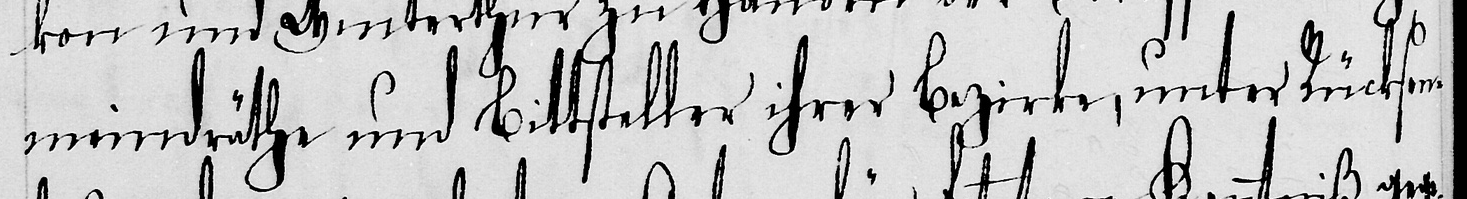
meindräthe und Bittsteller ihrer Bezirke, unter Rücksen¬
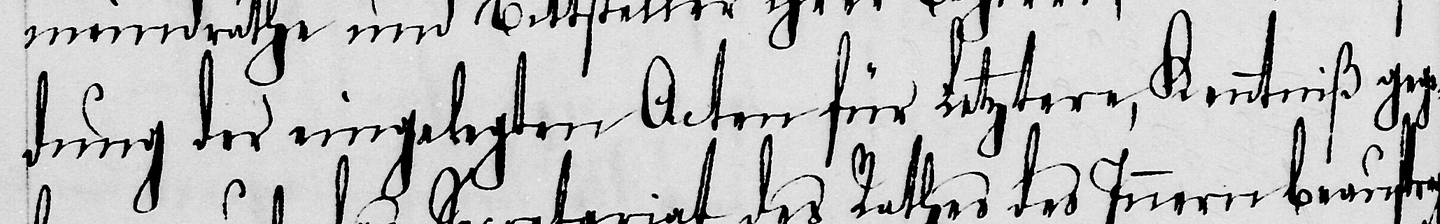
dung der eingelegten Acten für Letztere, Kenntniß g¬
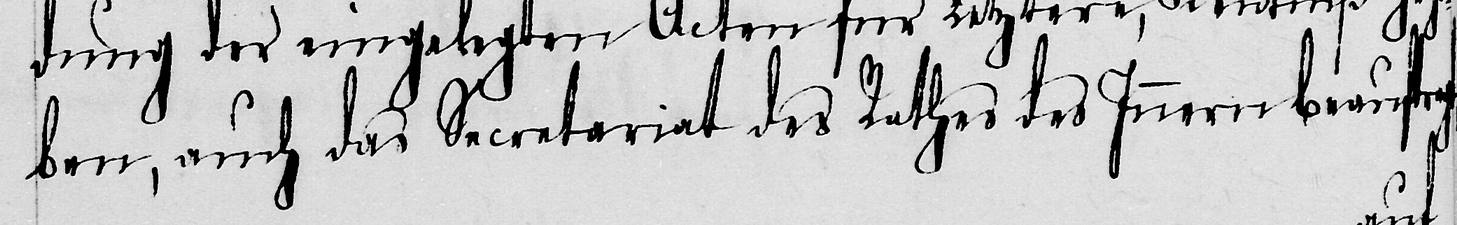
ben, auch das Secretariat des Rathes des Innern beauft¬
